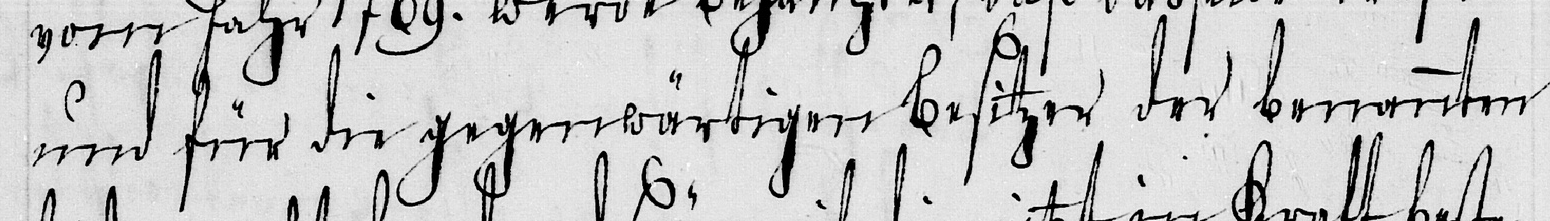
und für die gegenwärtigen Besitzer der benannten
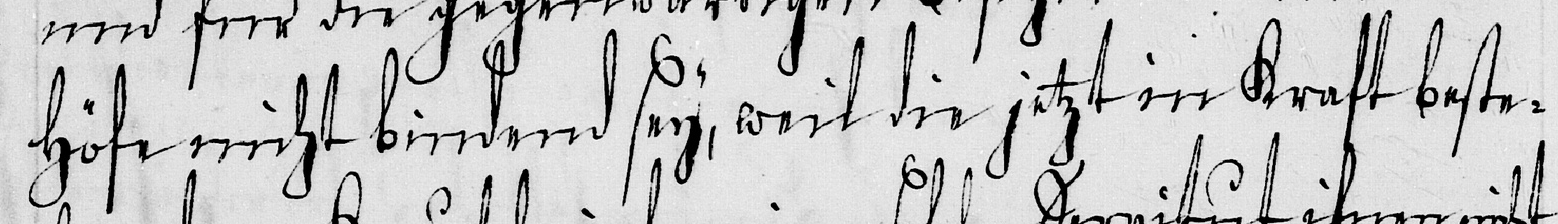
Höfe nicht bindend sey, weil die jetzt in Kraft beste¬
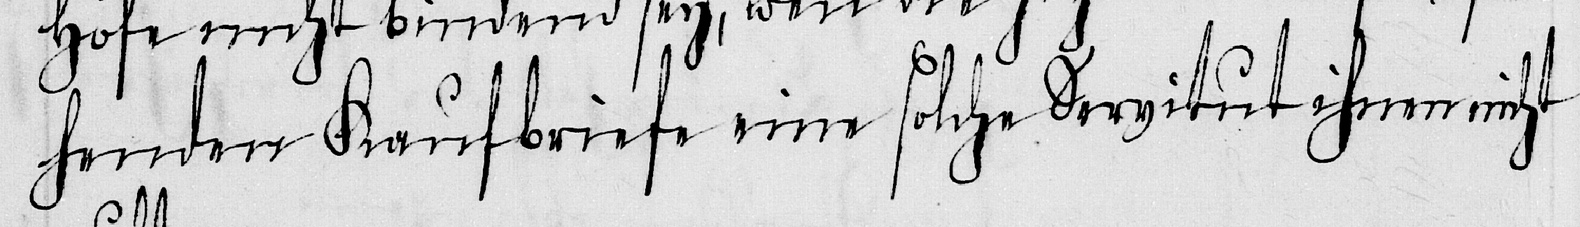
henden Kaufbriefe eine solche Servitut ihnen
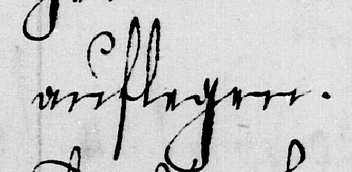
auflegen.
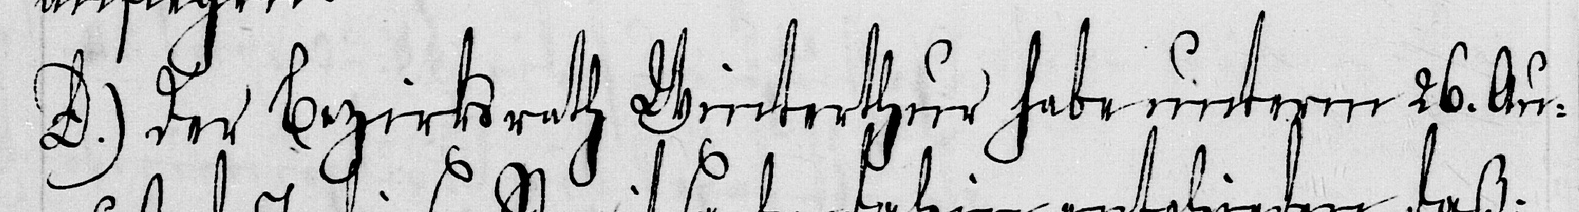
D.) Der Bezirksrath Winterthur habe unterm 26. Au¬
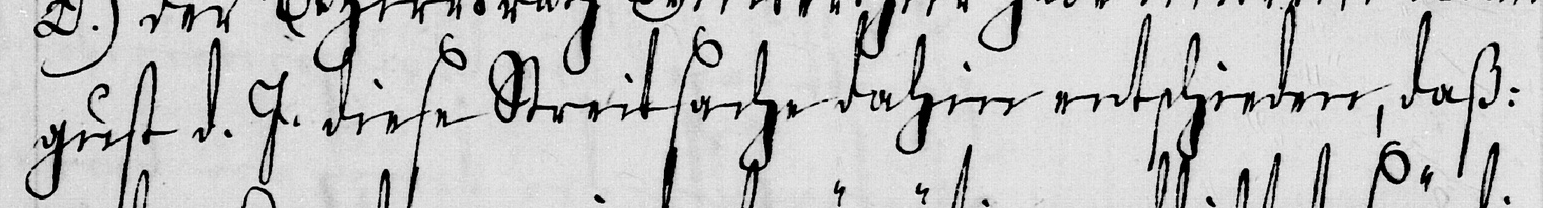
gust d. J. diese Streitsache dahin entschieden, daß:
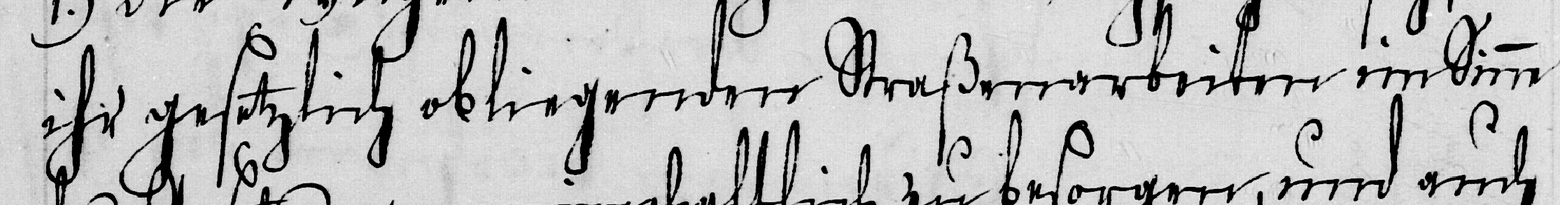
ihr gesetzlich obliegenden Straßenarbeiten im Sinne
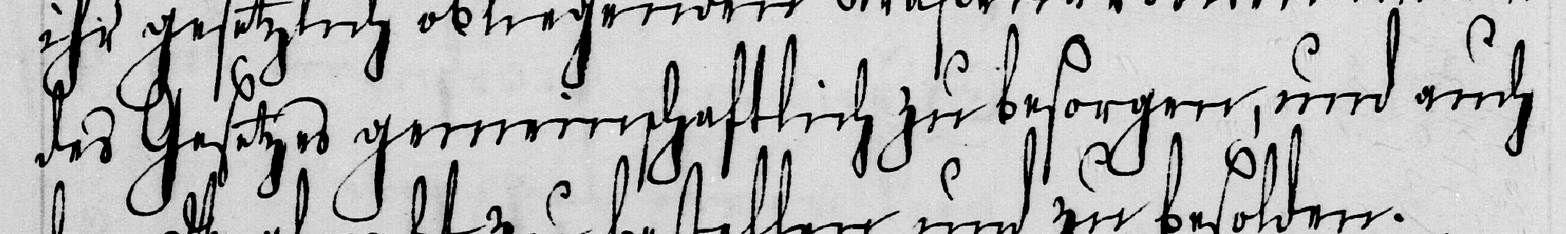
des Gesetzes gemeinschaftlich zu besorgen, und auch
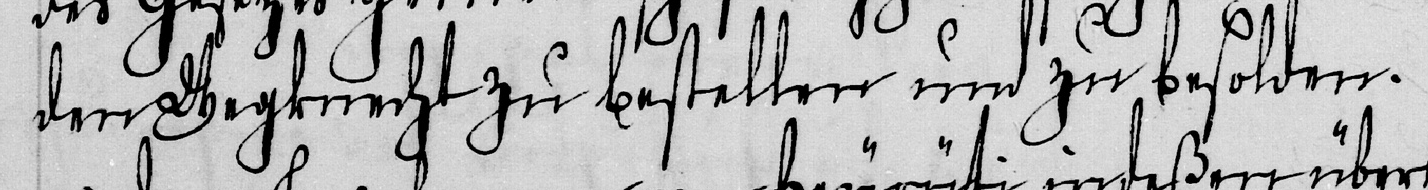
den Wegknecht zu bestellen und zu besolden.
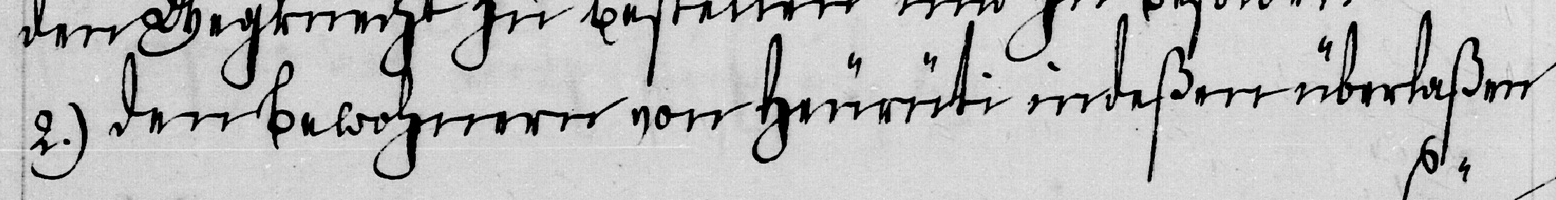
2.) den Bewohnern von Heurüti indeßen überlaßen
